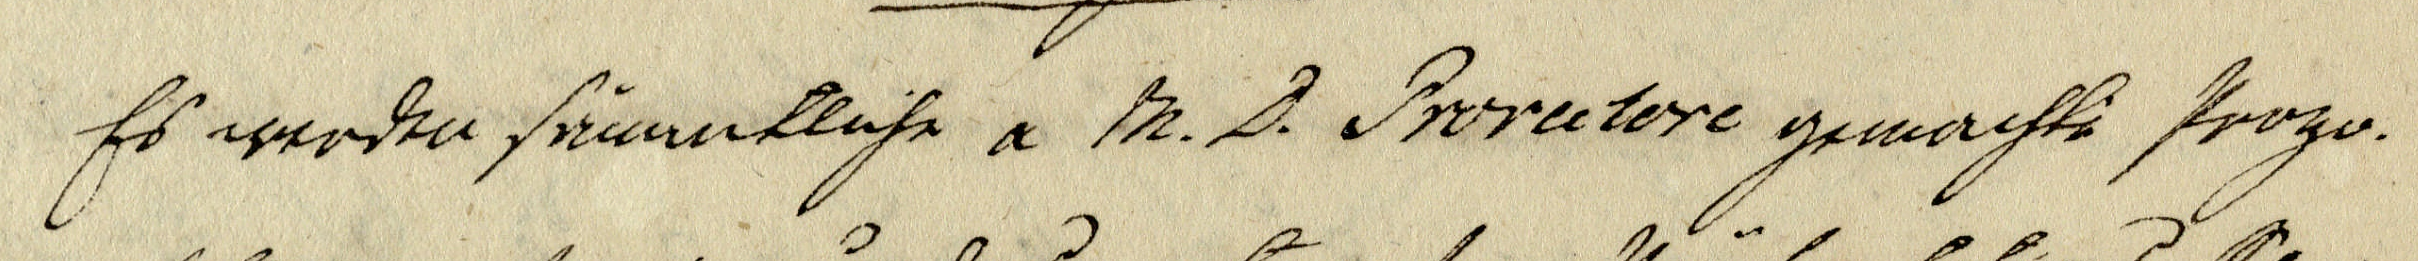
Es werden sämmtliche a M. D. Prorectore gemachte Propo¬
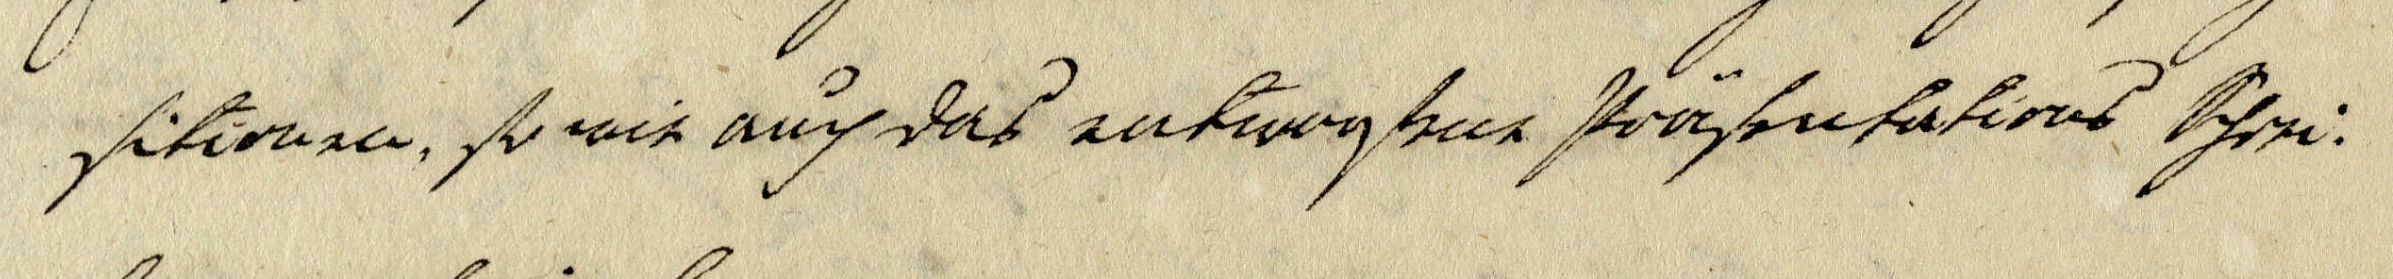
sitionen, so wie auch das entworfene Präsentations Schrei¬
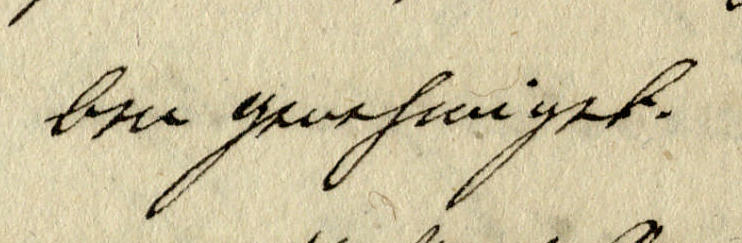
ben genehmiget.
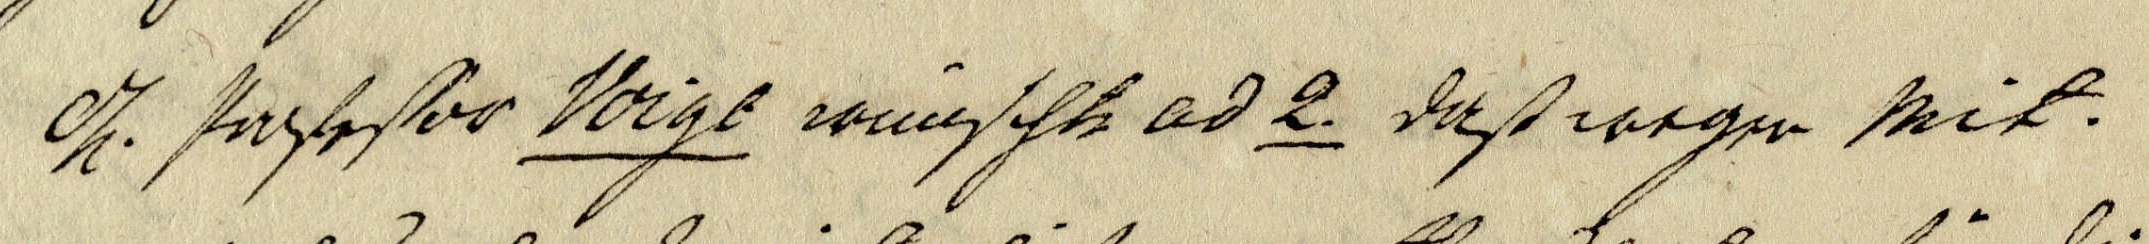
dh. Professor Voigt wünschte ad 2. daß wegen Mit¬
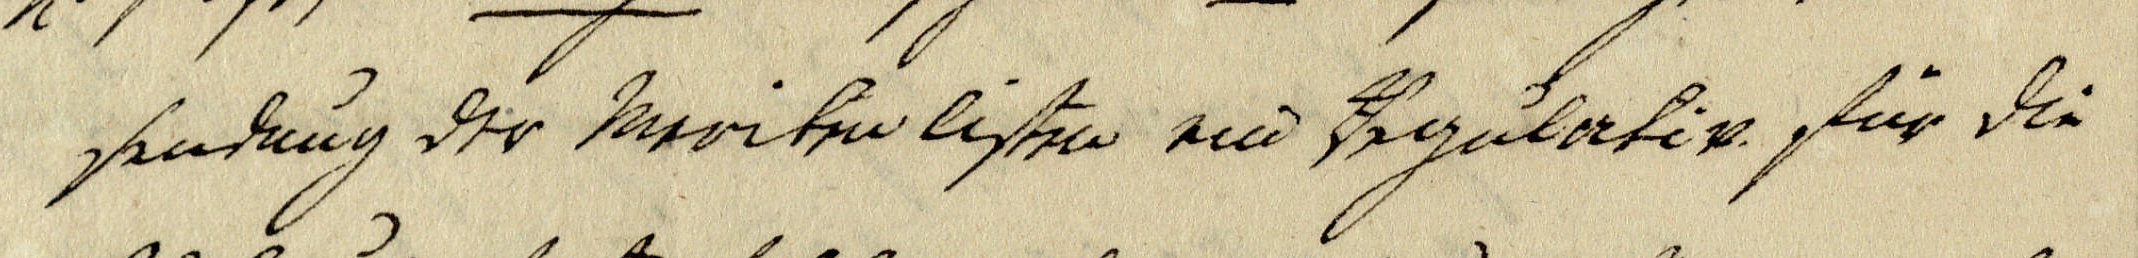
sendung der Meritenlisten ein Regulativ für die
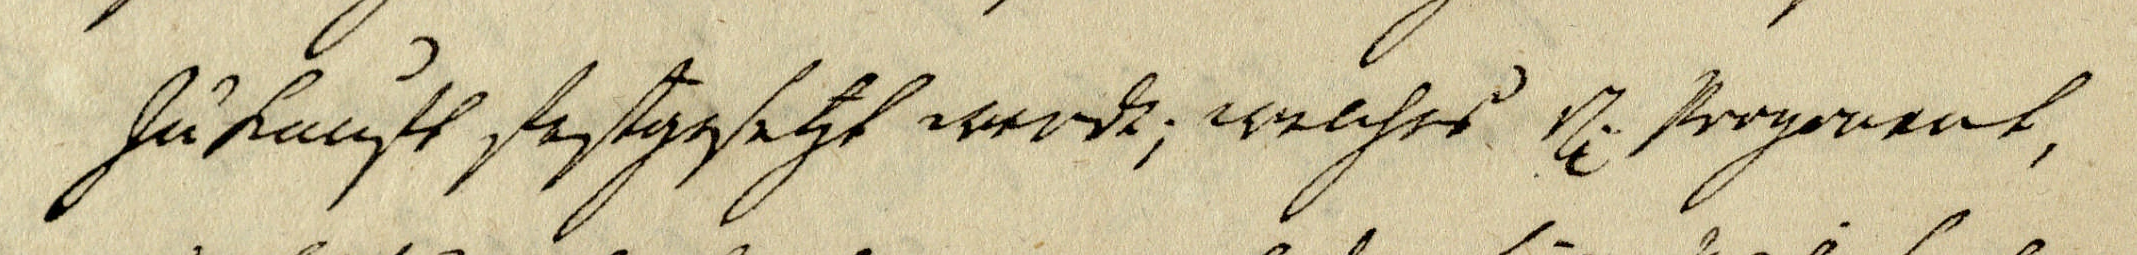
Zukunft festgesetzt werde; welches dh. Proponent,
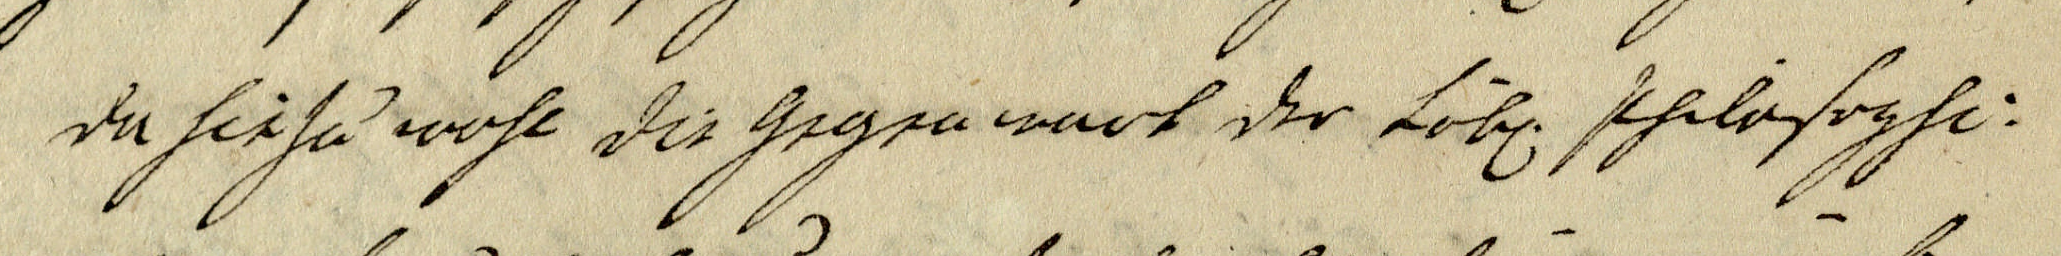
da hiezu wohl die Gegenwart der Löbl. Philosophi¬
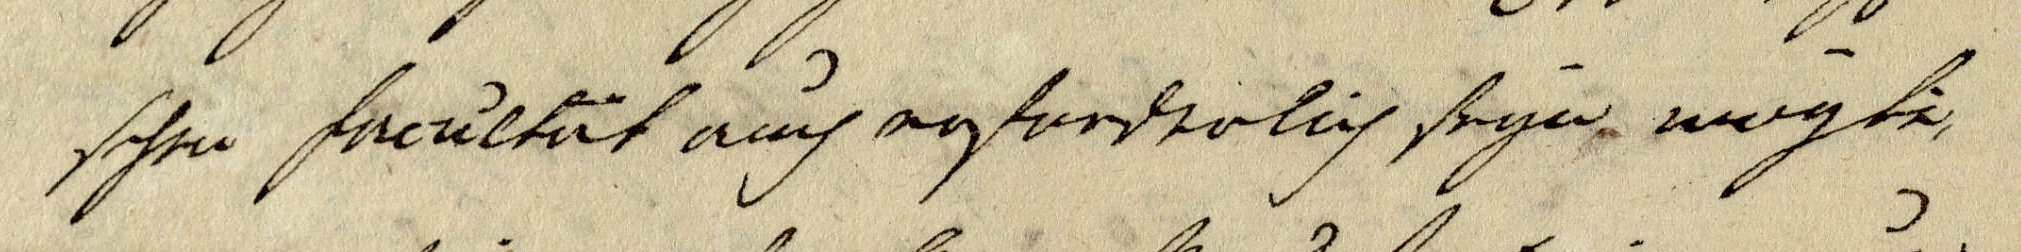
schen Facultät auch erforderlich seÿn mögte,
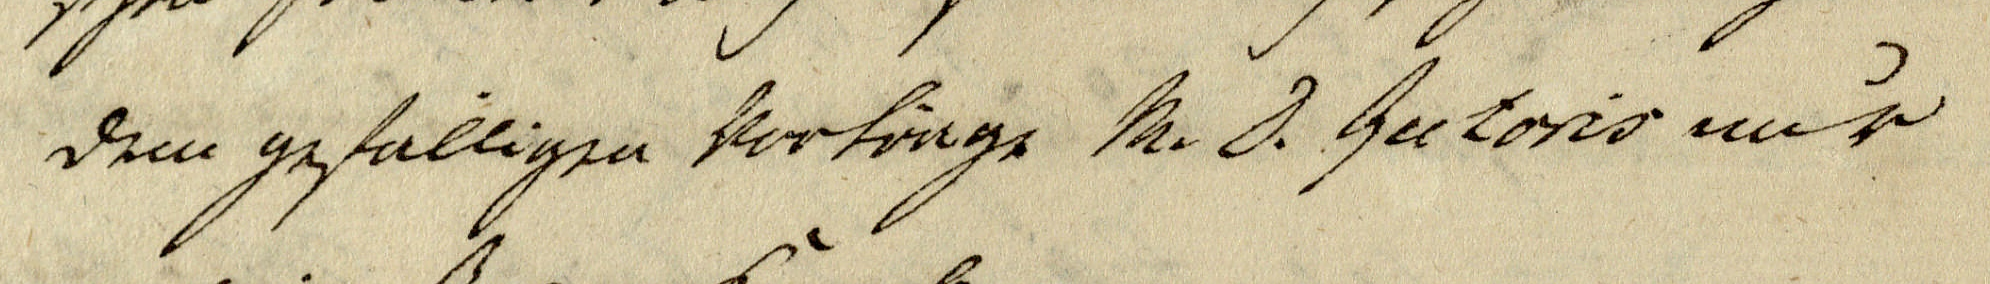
dem gefälligen Vortrage M. D. Rectoris nur
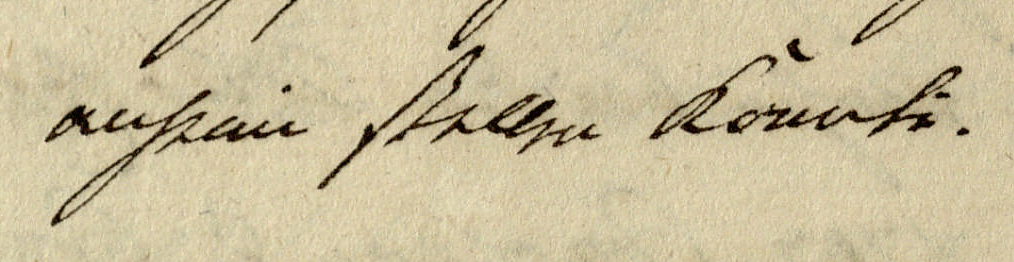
anheim stellen könnte.
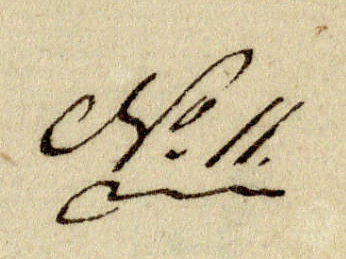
No 11.
